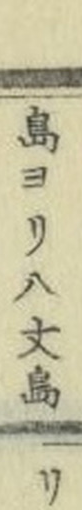島ヨリ八丈島
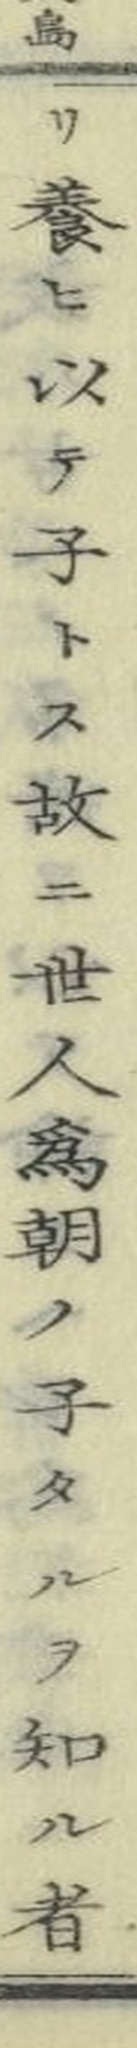リ養ヒ以テ子トス故ニ世人爲朝ノ子タルヲ知ル者
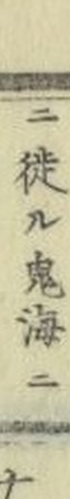ニ徒ル鬼海ニ
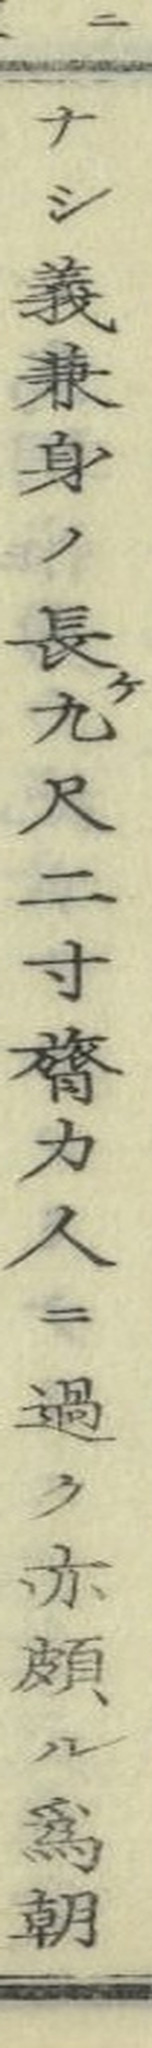ナシ義兼身ノ長九尺二寸膂力人ニ過ク亦頗ル爲朝
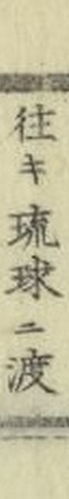往キ琉球ニ渡
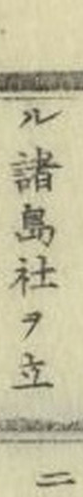ル諸島社ヲ立
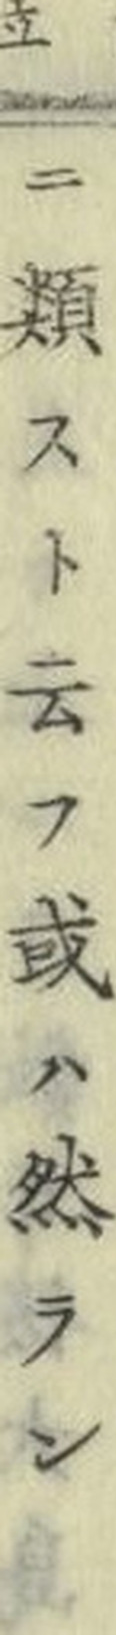ニ類スト云フ或ハ然ラン
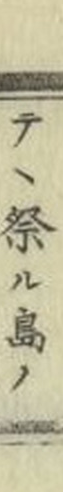テヽ祭ル島ノ
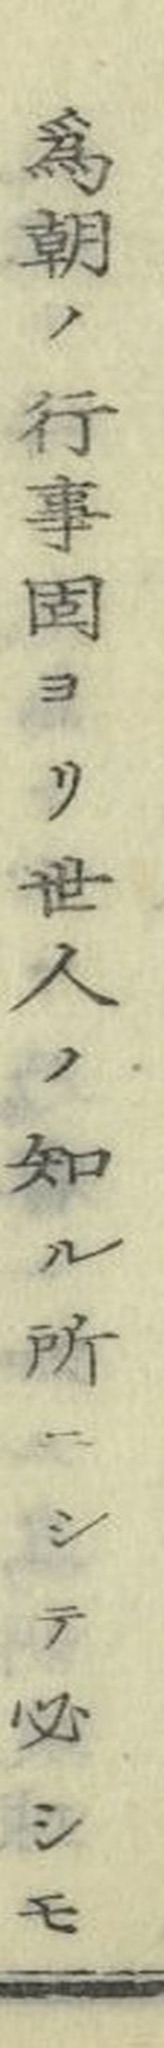爲朝ノ行事固ヨリ世人ノ知ル所ニシテ必シモ
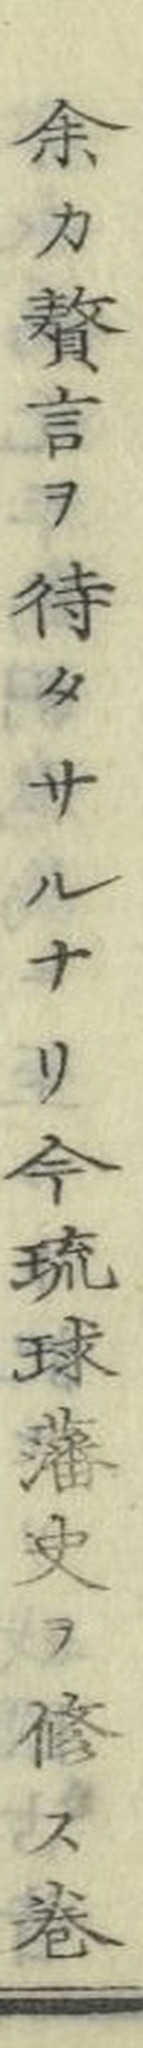余カ贅言ヲ待タサルナリ今琉球藩史ヲ修ス巻
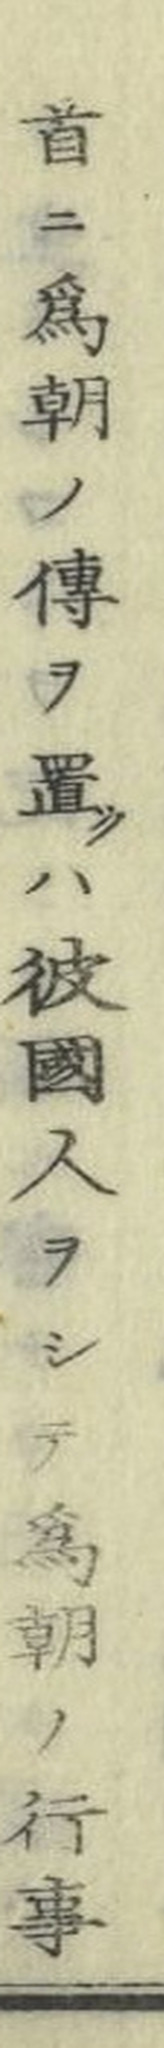首ニ爲朝ノ傳ヲ置ハ彼國人ヲシテ爲朝ノ末路ヲ
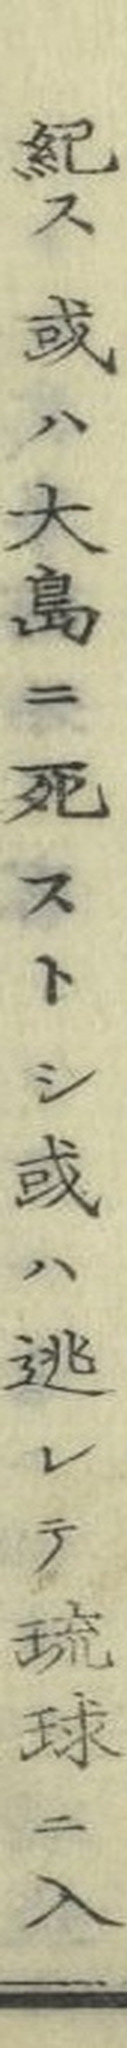紀ス或ハ大島ニ死ストシ或ハ逃レテ琉球ニ入

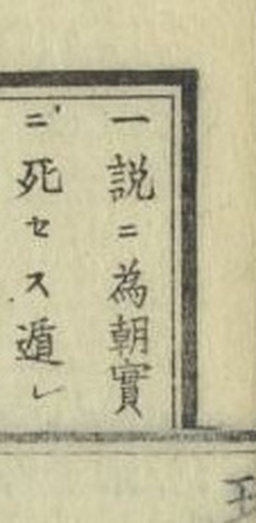一説ニ為朝實
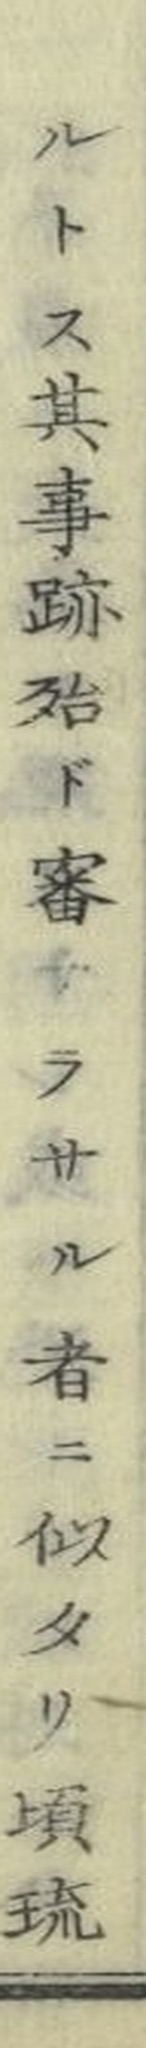ルトス其事跡殆ド審ナラサル者ニ似タリ頃琉
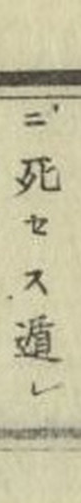ニ死セス遁レ
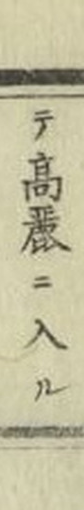テ髙麗ニ入ル
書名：琉球藩史 一之巻
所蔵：University of the Ryukyus Library
